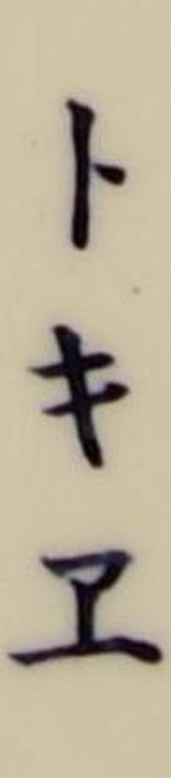トキエ
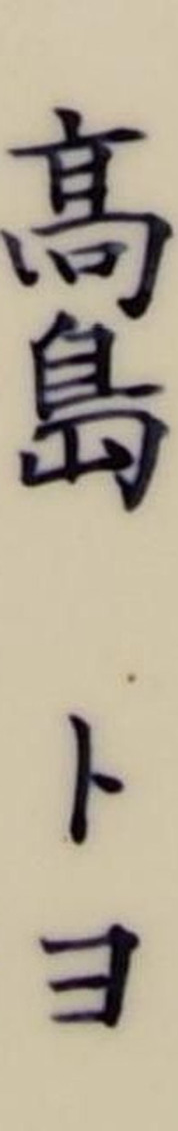高島トヨ
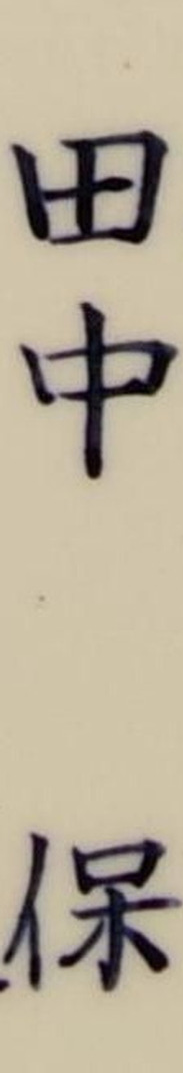田中保
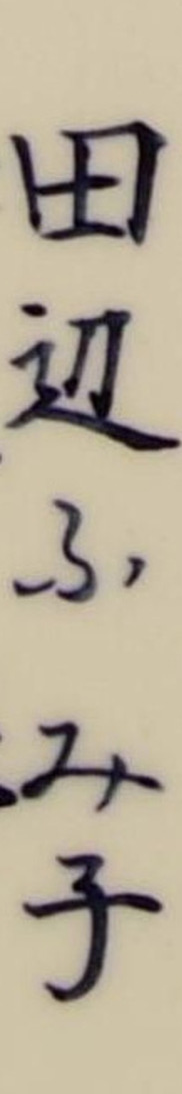田辺ふみ子
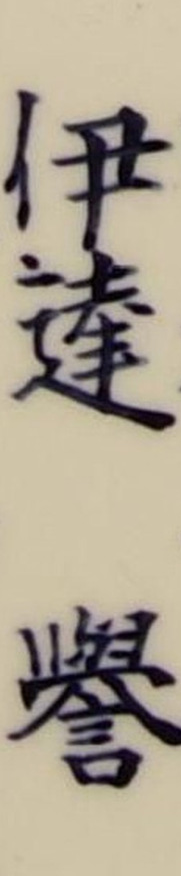伊達誉
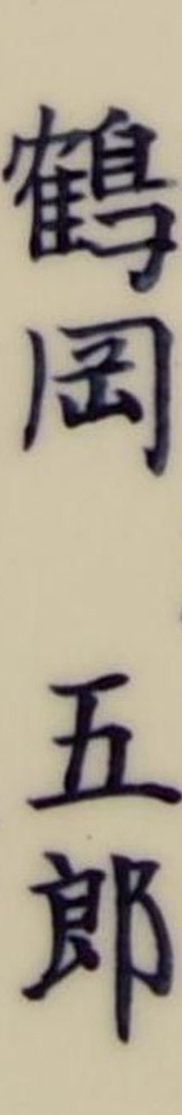鶴岡五郎
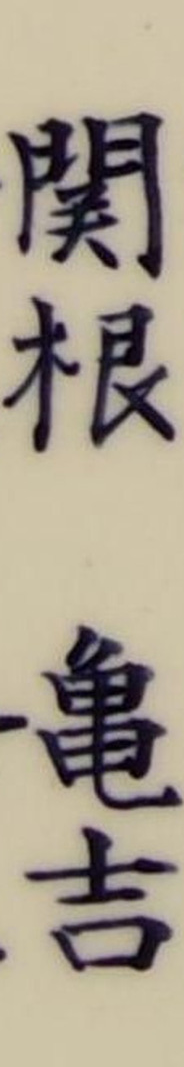関根亀吉
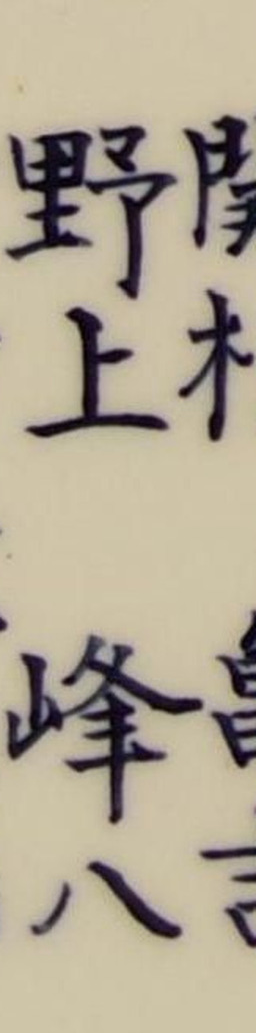野上峰八
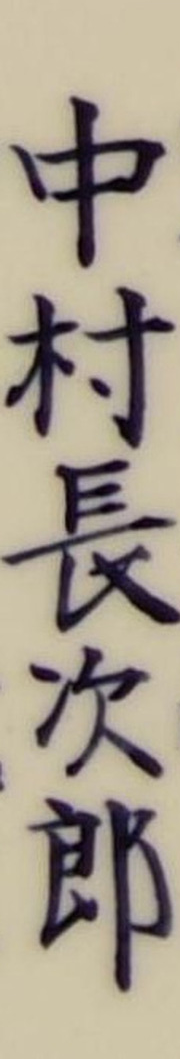中村長次郎
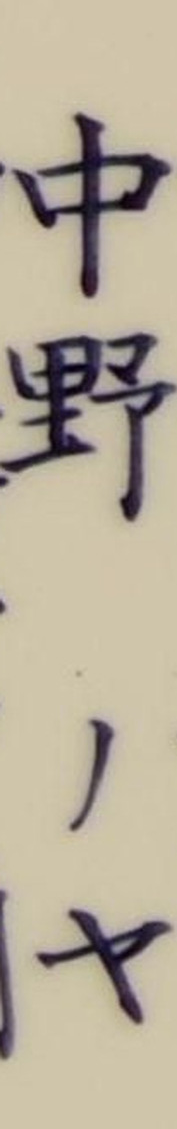中野ノヤ
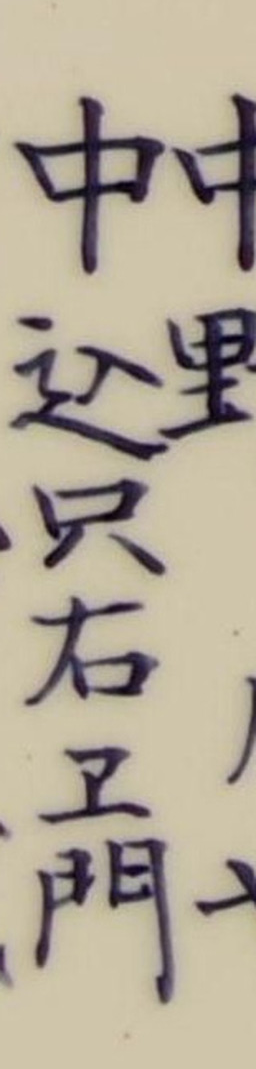中込只右ヱ門

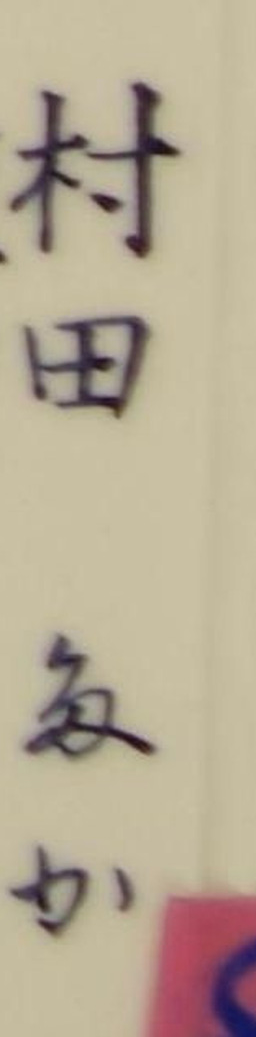村田たか
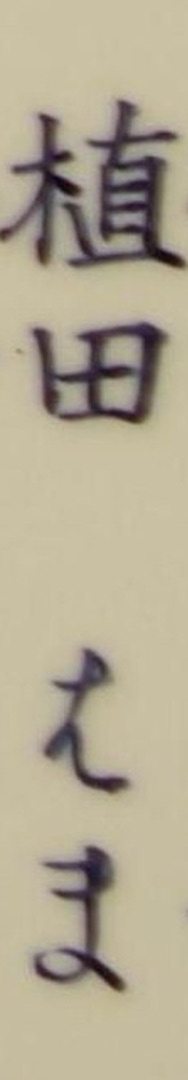植田はま
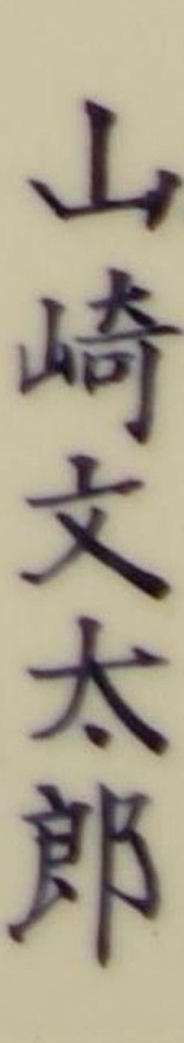山崎文太郎
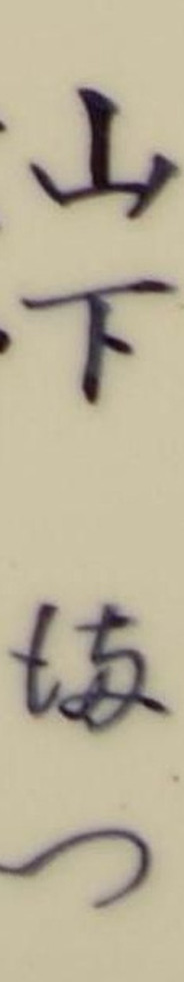山下まつ
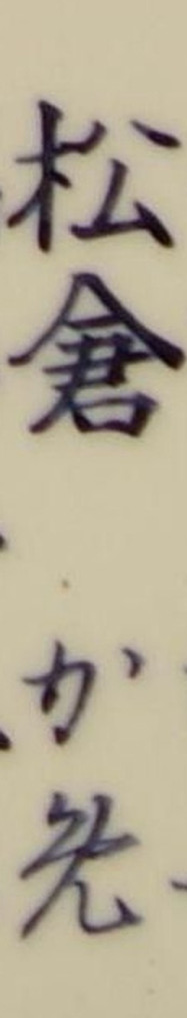松倉かめ
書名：E~L
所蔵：高野山金剛峯寺
